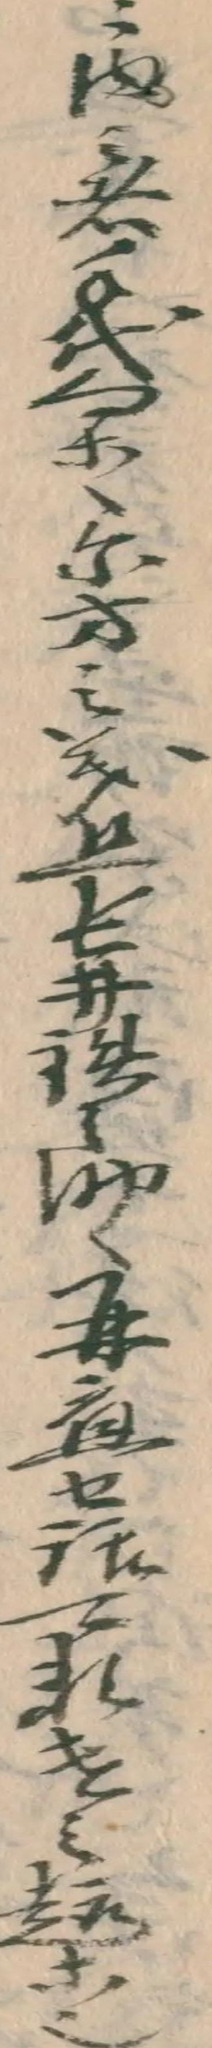ニ内々者手代向等へ示方之義且長井鉄之助へ再應世話可頼遣之趣等也
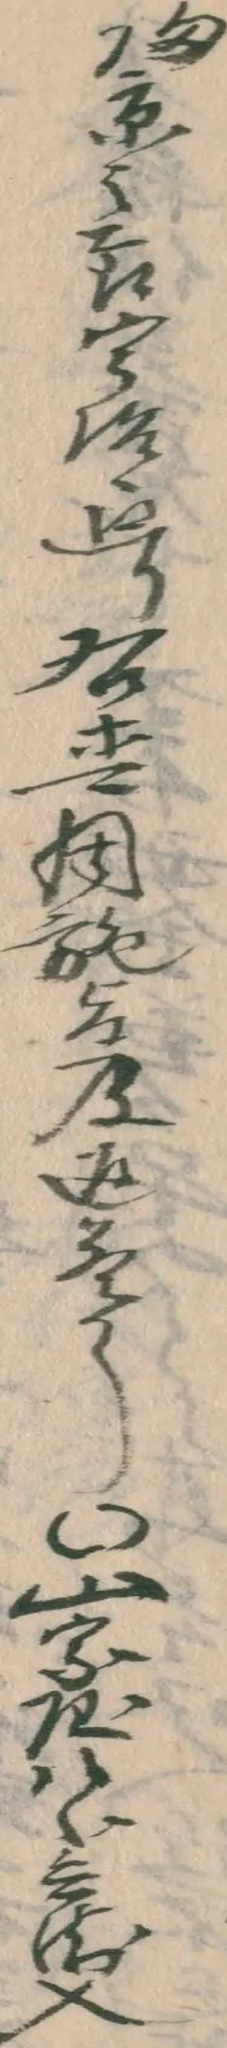帰京之節宇治へ廻り右等可調施旨及返答了〇山家屋八郎兵衛入
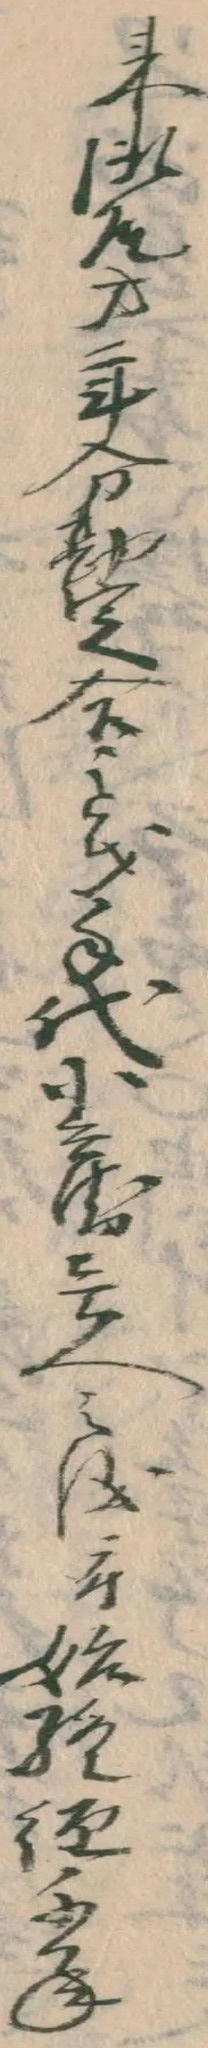来瀬尾方年分勘定合之義手代小兵衛壱人之儀ニ付始終経千年
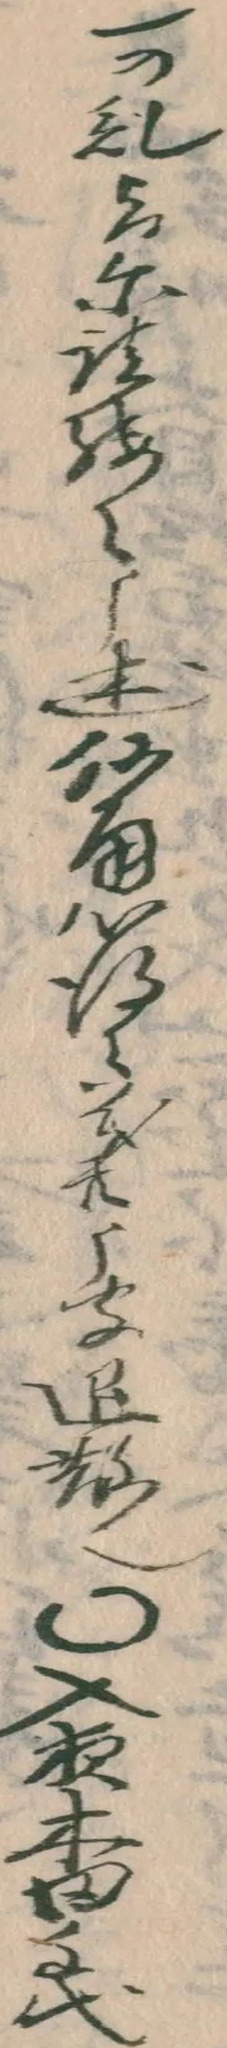可糺旨示談残々申述何角心得候義共申聞追散也○入夜木田手代
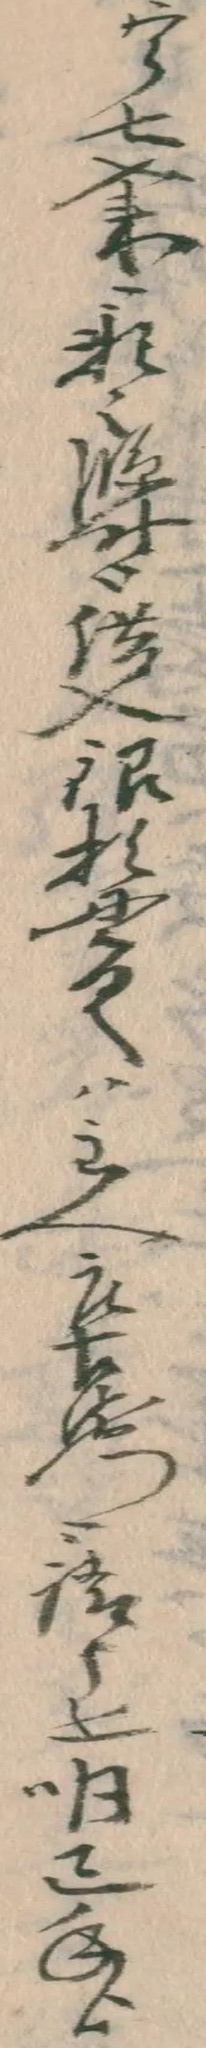宇七入来御頼之臨時御借入銀拾貫匁ハ主人庄左衛門御請申上明巳年ゟ
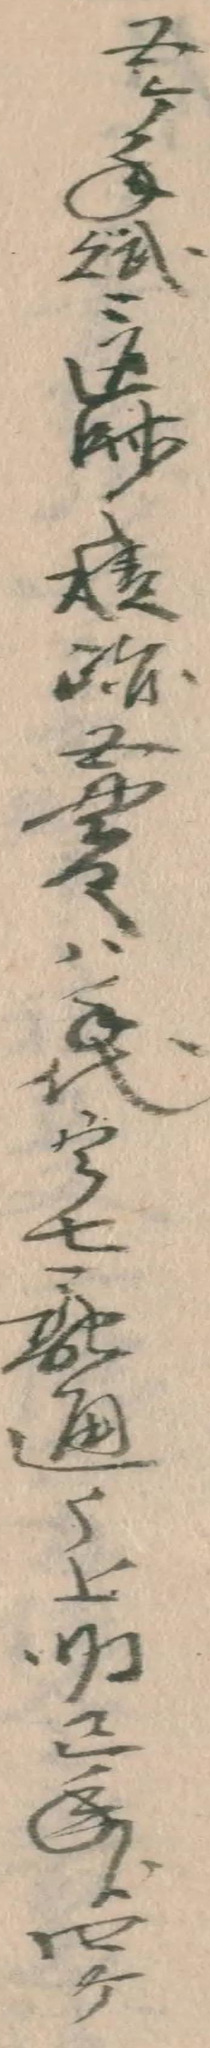五ヶ年賦御返済之積跡五貫匁ハ手代宇七御馳通申上明已年ゟ四ヶ
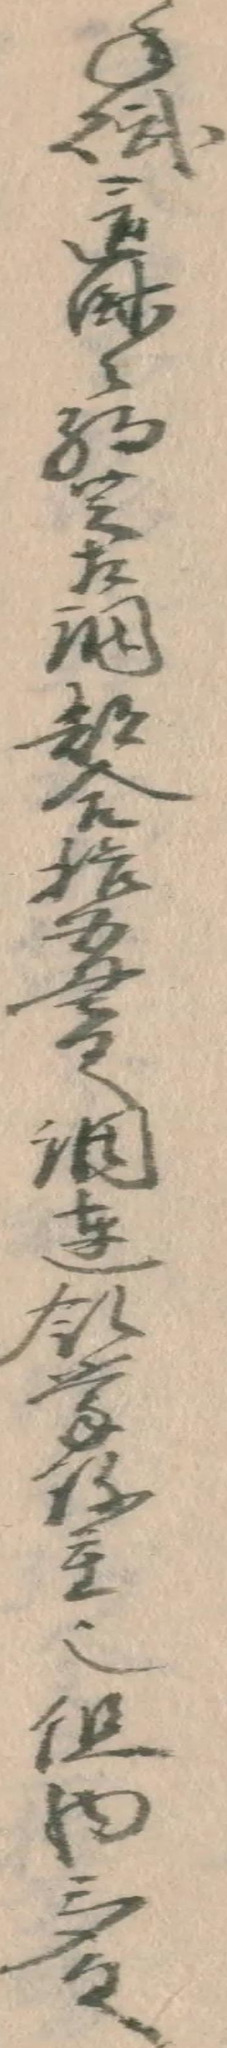年賦御追済之約定相調都合拾五貫匁調達領掌珍重也但内三匁
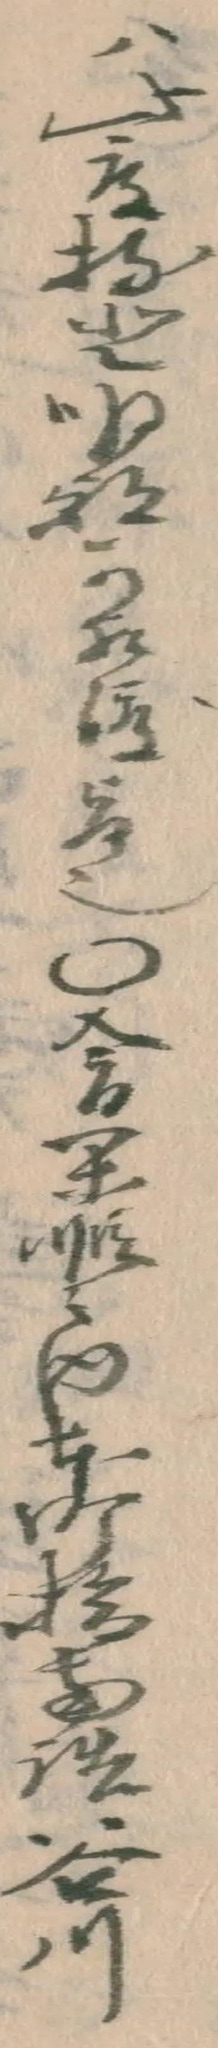ハ此度持登明願可相渡旨也○今日閑暇之内本町橋南詰谷川
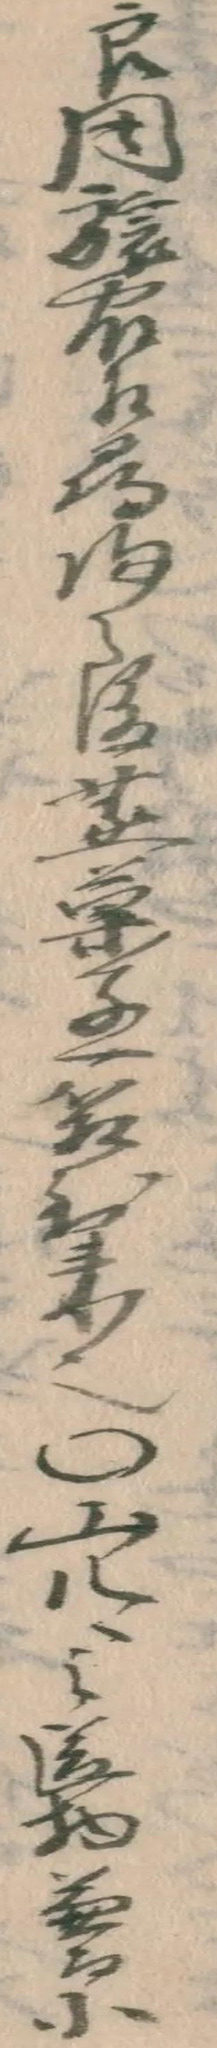良調旅宿江尋帰之後蒸菓子一箱到来也○山口へ之送物兼而小
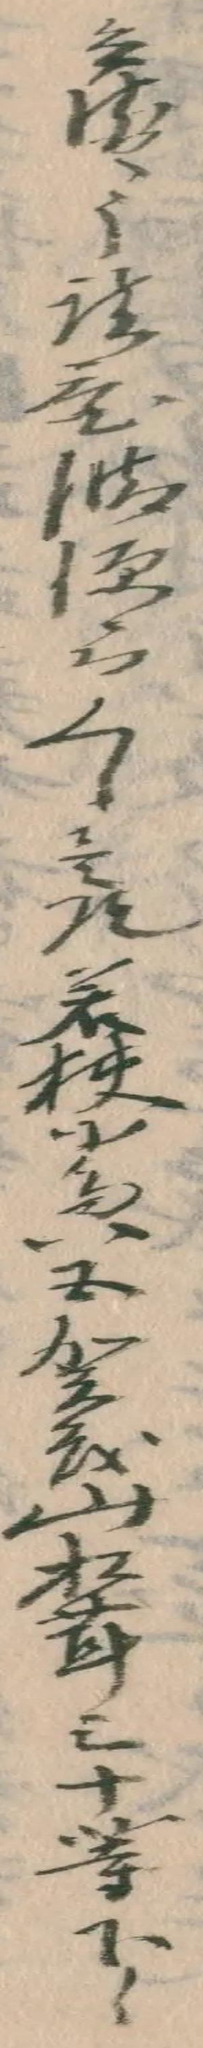兵衛へ申請置波源に而くし壱丸若狭小円八五賀茂山松茸三十等下り
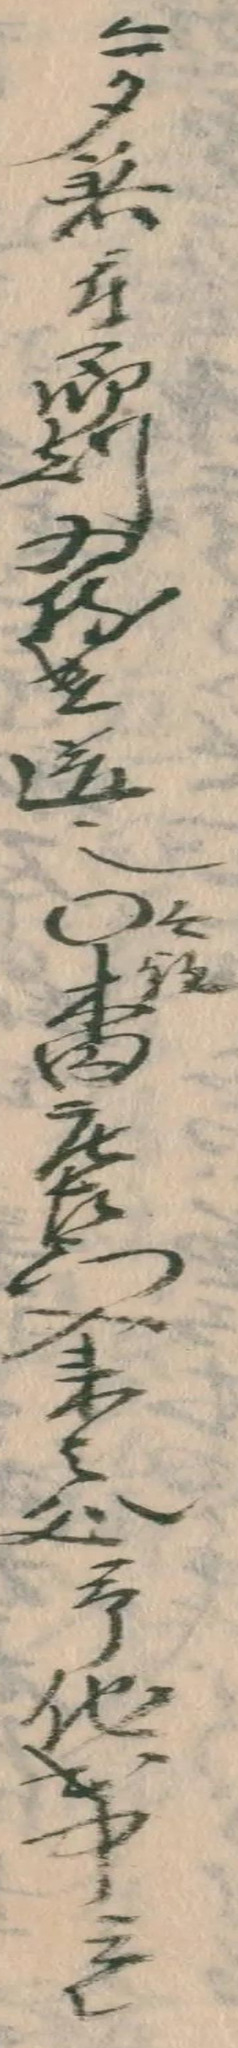今夕著ニ付即刻為持遣送也○今朝木田庄左衛門入来之処予他出中云々
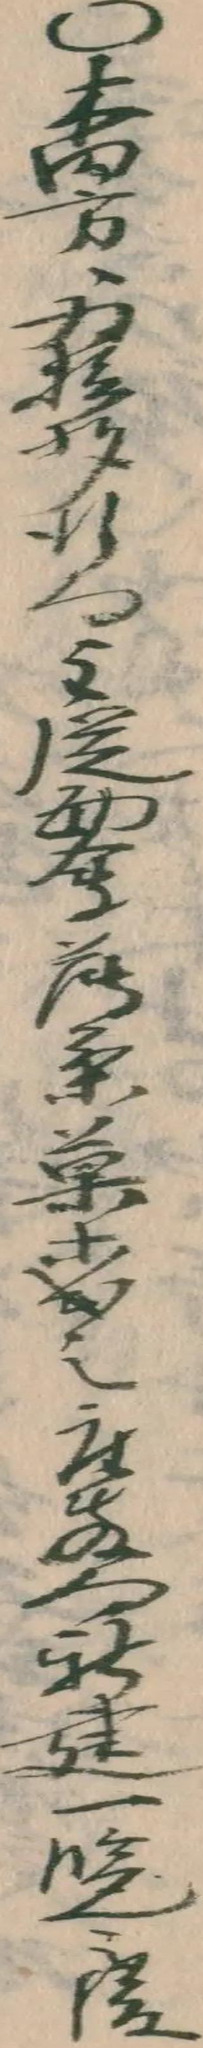○木田方ヘ為挨拶行向主従面會薄茶菓等出之座敷向新建一覧之後
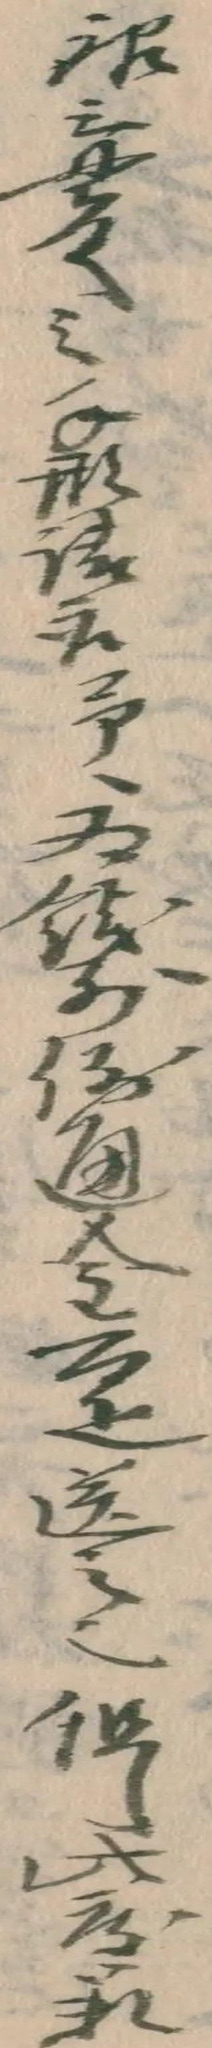銀三貫匁之手形請取予へ為餞別例通金百疋送之也但し此度御頼
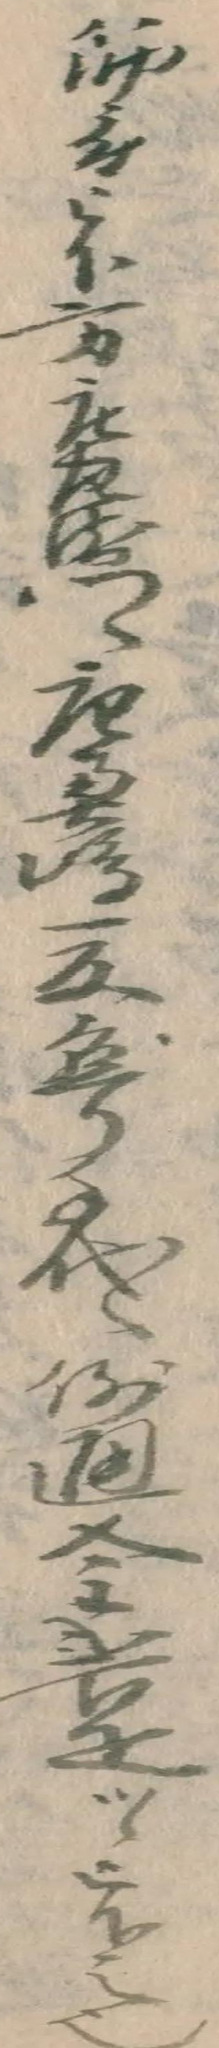筋ニ付被下方庄左衛門へ座奥嶋一反懸り手代へ例通金弐百疋ツヽ被下之也
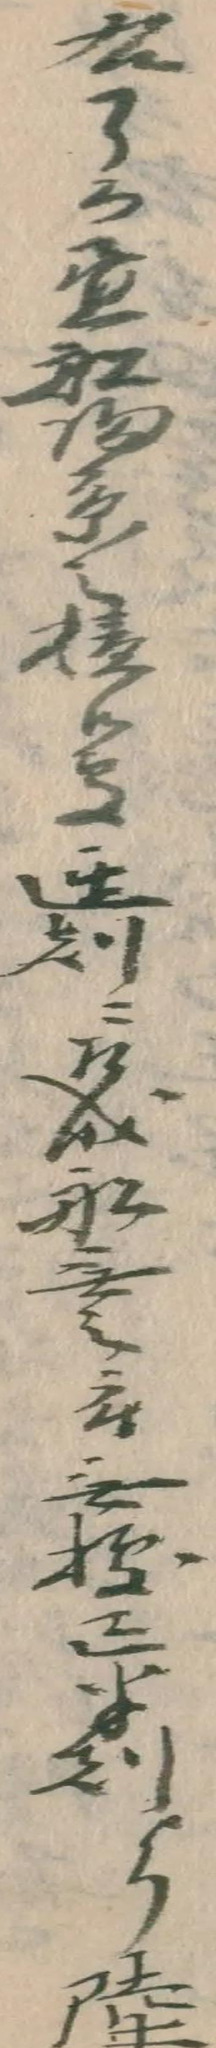右了而昼舩帰京之積候處遅刻ニ相成舩無之ニ付無拠巳半刻より陸
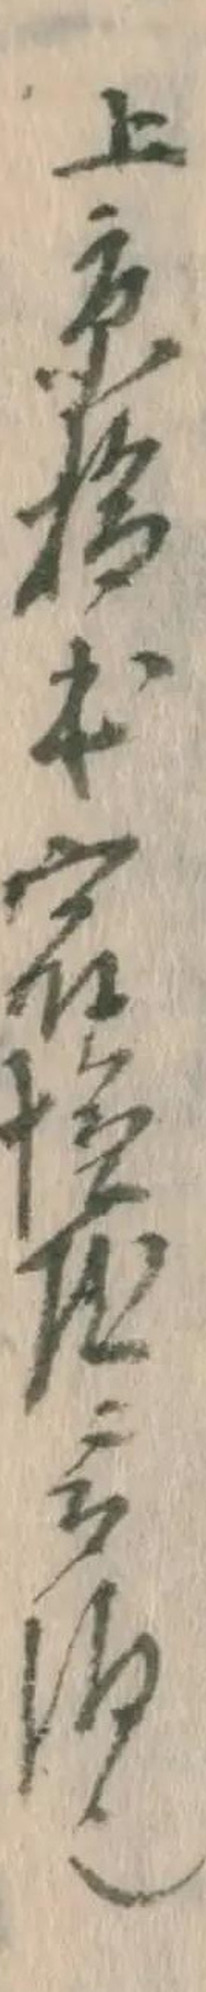上京橋本宿塩屋ニ而泊也
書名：賀茂社記録. 第69冊
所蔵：国立国会図書館 National Diet Library, JAPAN
